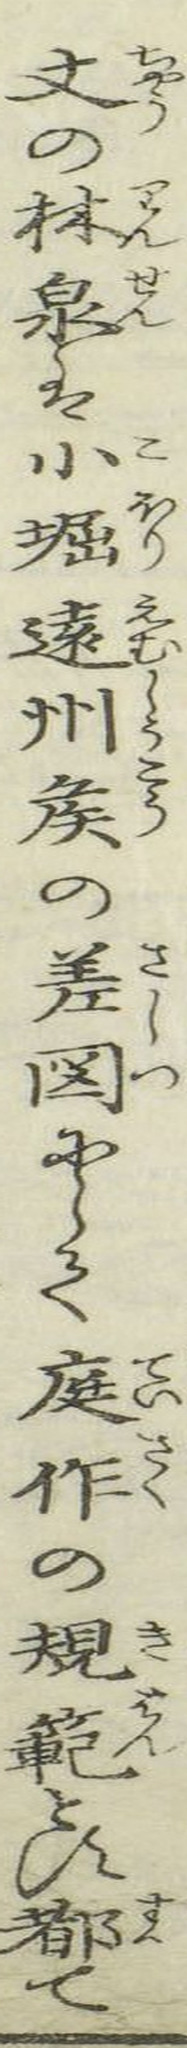丈の林泉は小堀遠州矦の差図にして庭作の規範とす都て
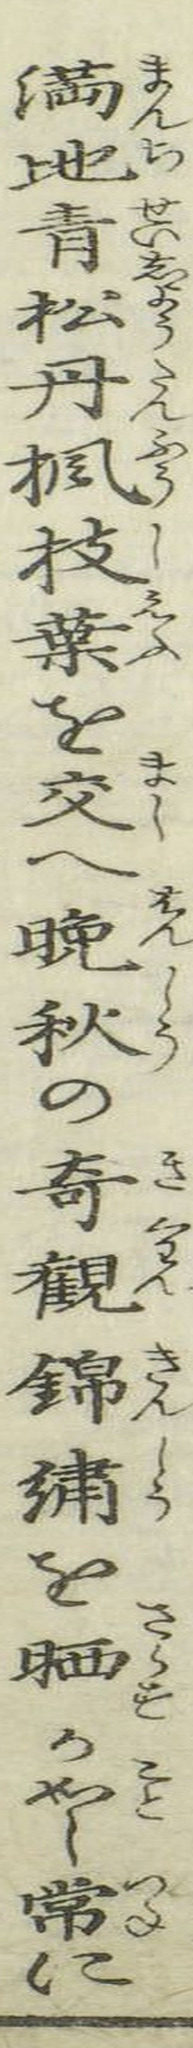満地青松丹楓枝葉を交へ晩秋の奇観錦繍を晒か如し常に
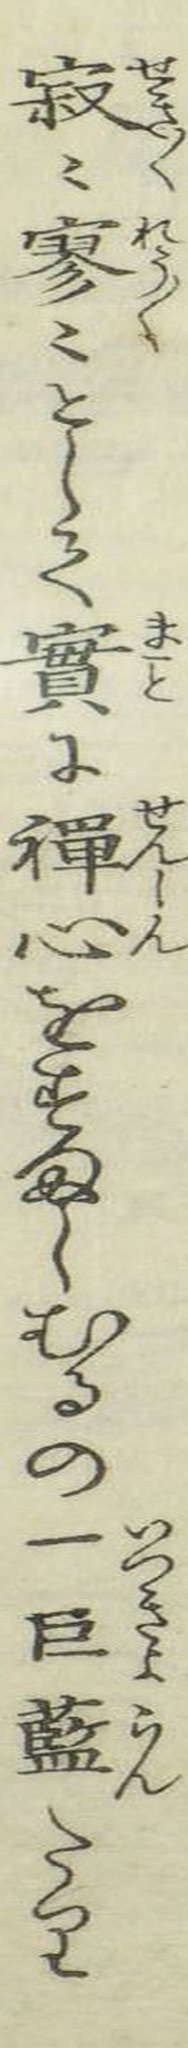寂々寥々として實に禪心をすましむるの一巨藍たり

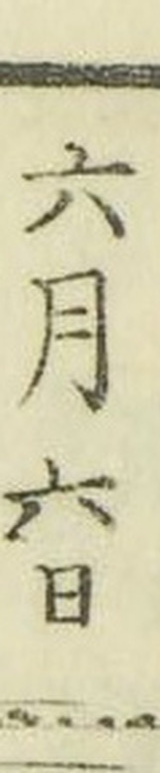六月六日
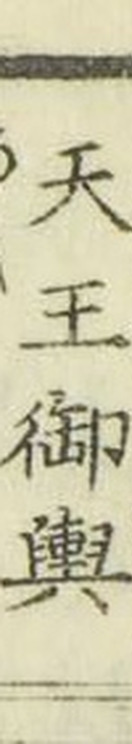天王御輿
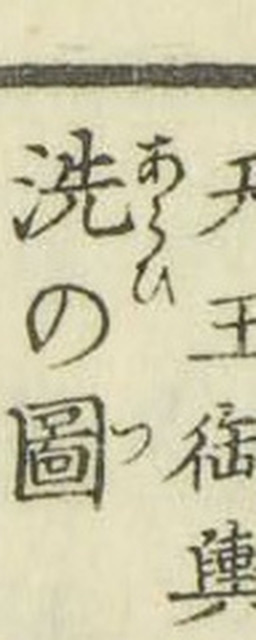洗の圖
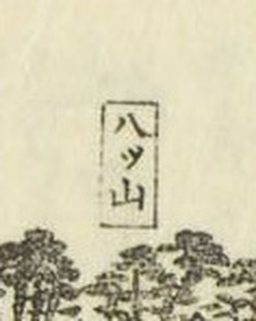八ツ山

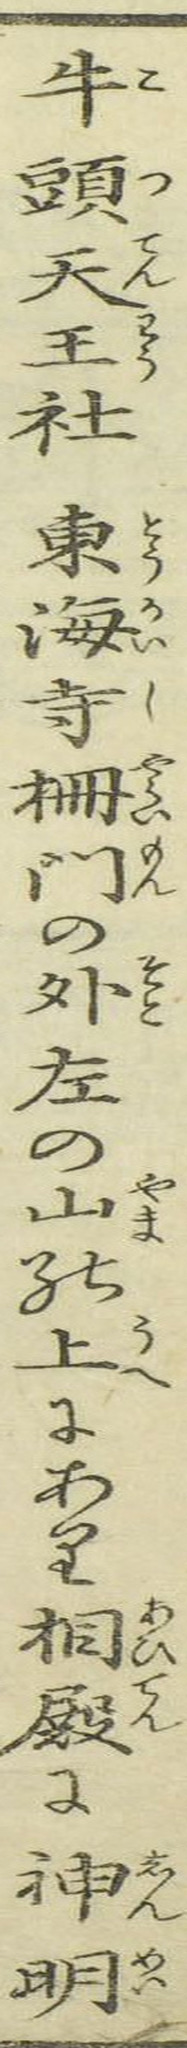牛頭天王社東海寺柵門の外左の山の上にあり相殿に神明
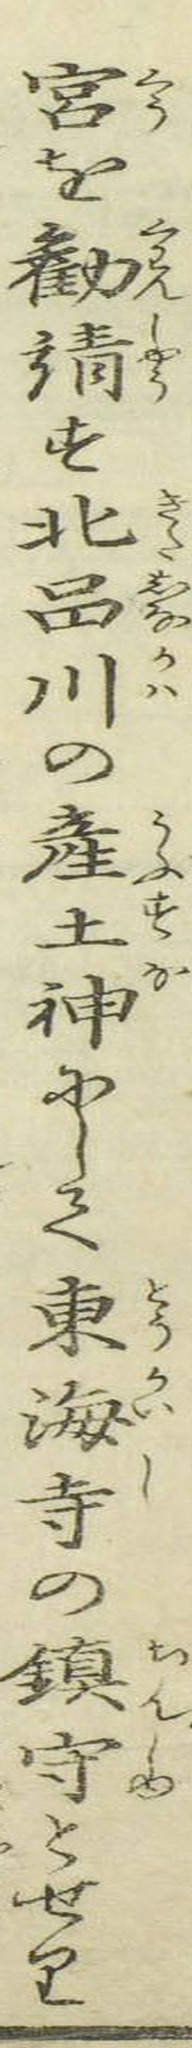宮を勧請す北品川の産土神にして東海寺の鎮守とせり
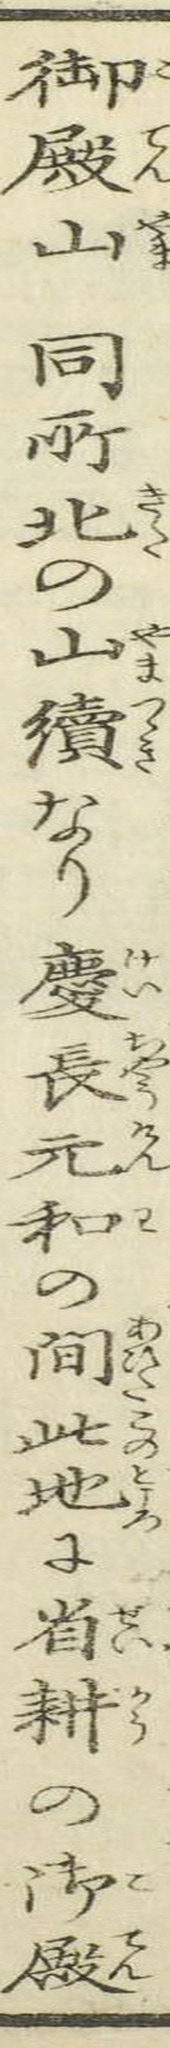御殿山同所北の山續なり慶長元和の間此地に省耕の御殿
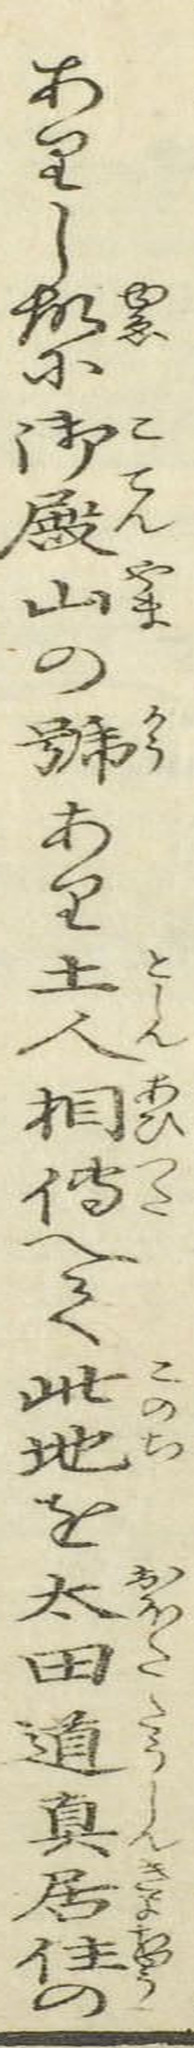ありし故に御殿山の號あり土人相傳へて此地を太田道真居住の
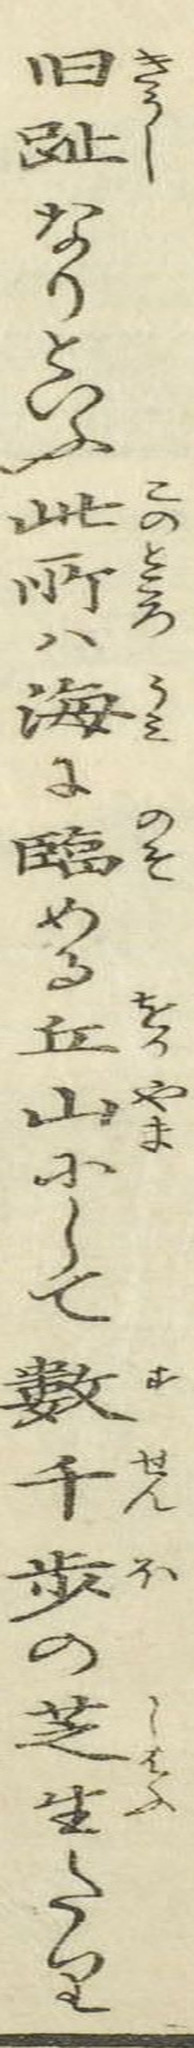旧趾なりといふ此所は海に臨める丘山にして數千歩の芝生たり
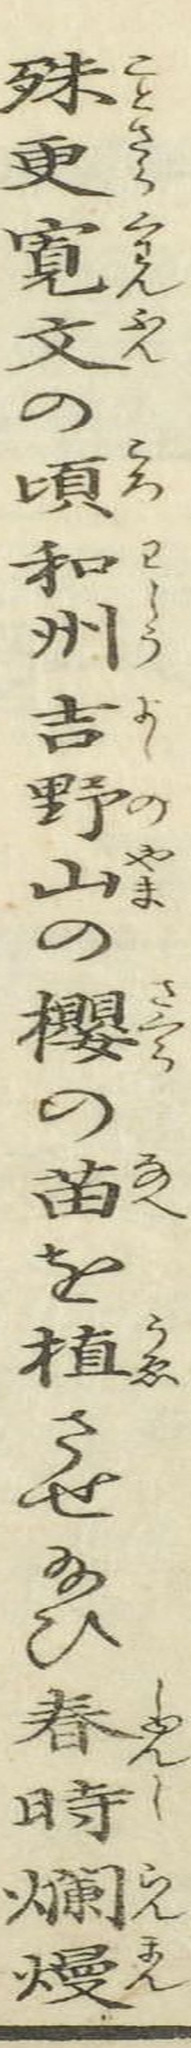殊更寛文の頃和州吉野山の櫻の苗を植させ給ひ春時爛熳
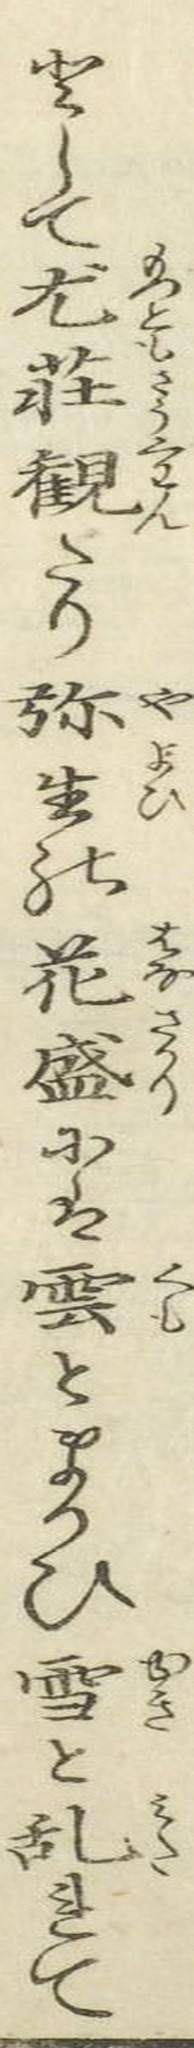として尤荘観たり弥生の花盛には雲とまかひ雪と乱れて
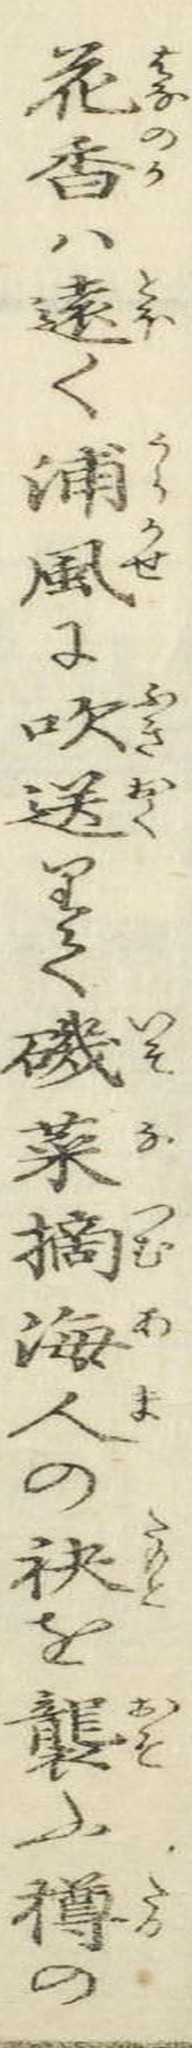花香は遠く浦風に吹送りて磯菜摘海人の袂を襲ふ樽の
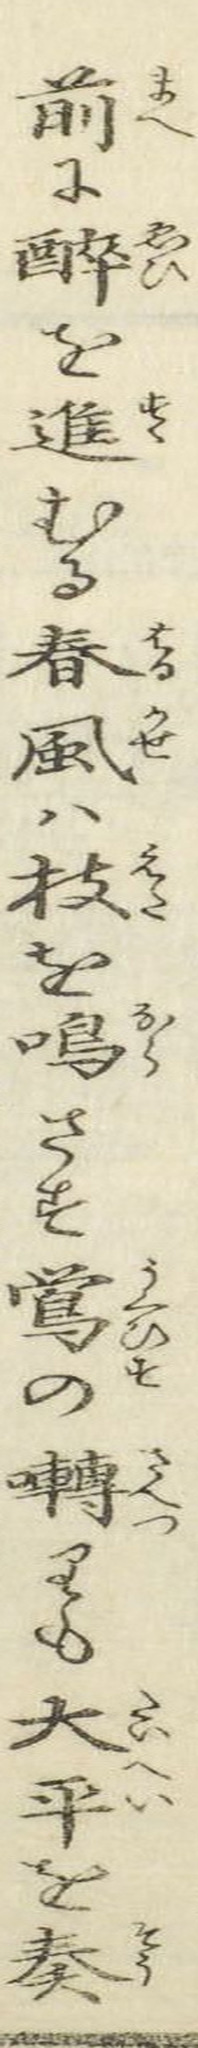前に醉を進むる春風は枝を鳴さす鶯の囀りも大平を奏
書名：江戸名所図会 20巻 巻之4
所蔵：東京学芸大学教育コンテンツアーカイブ
